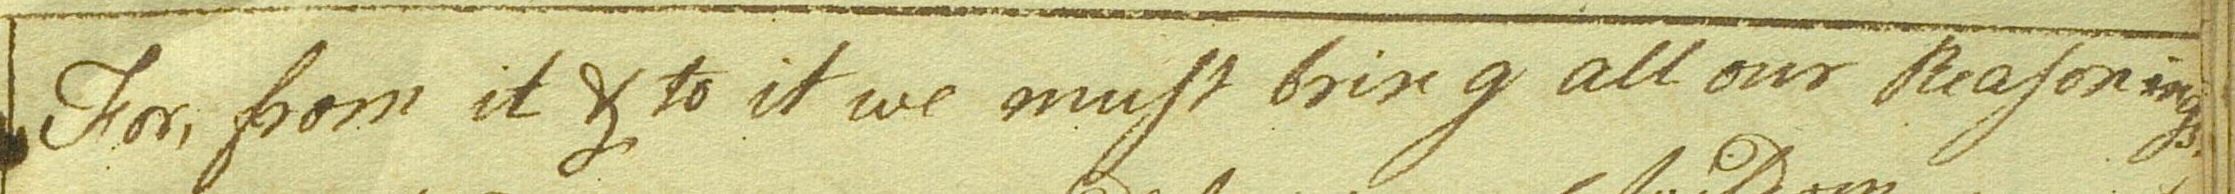For, from it & to it we must bring all our Reasonings.
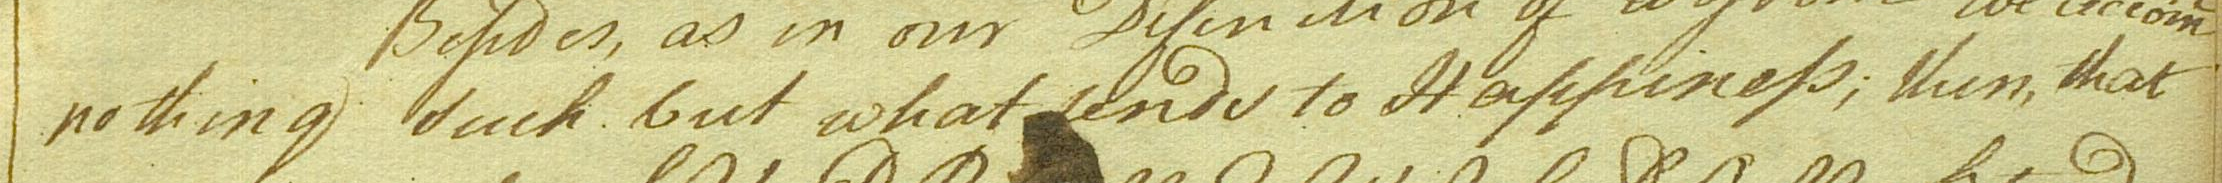nothing such but what tends to Happiness; then, that
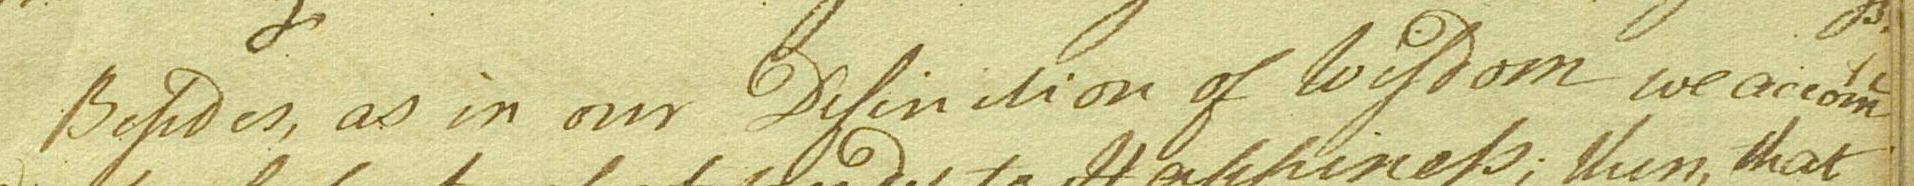Besides, as in our Definition of Wisdom we account
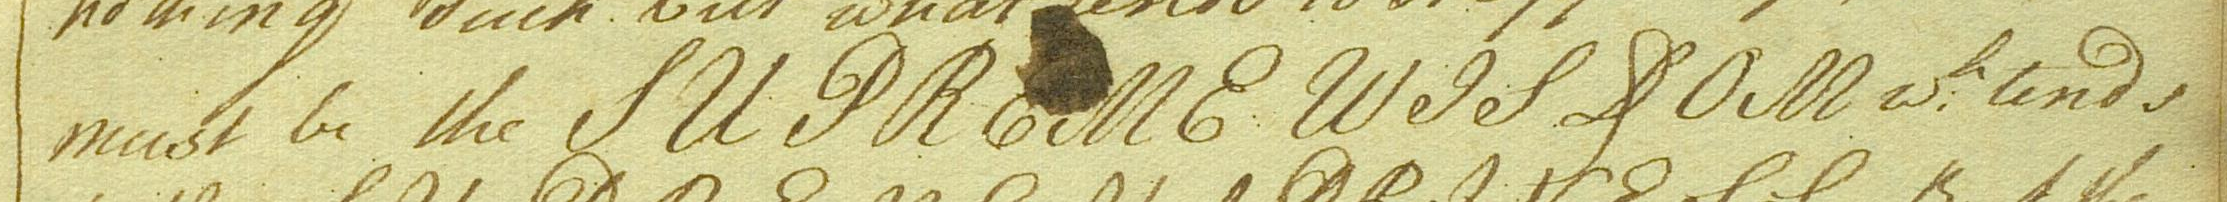must be the SUPREME WIDSOM w^h. tends
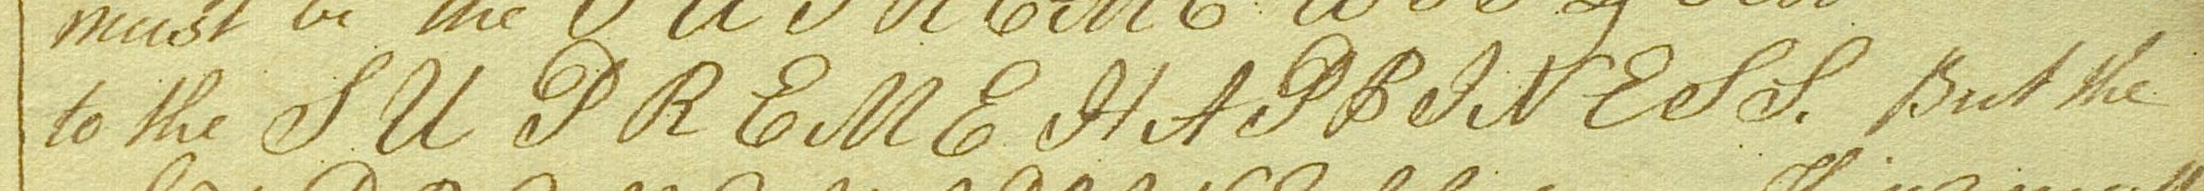to the SUPREME HAPPINESS. But the
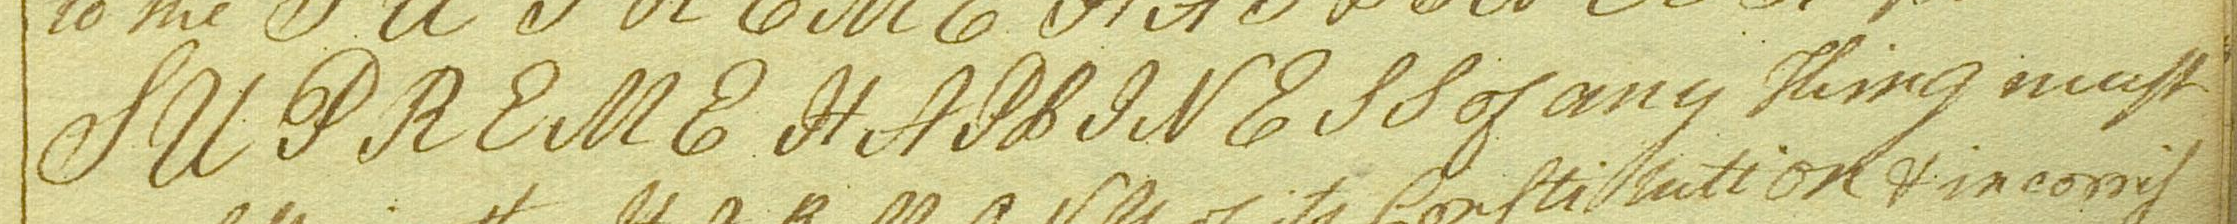SUPREME HAPPINESS of any thing must
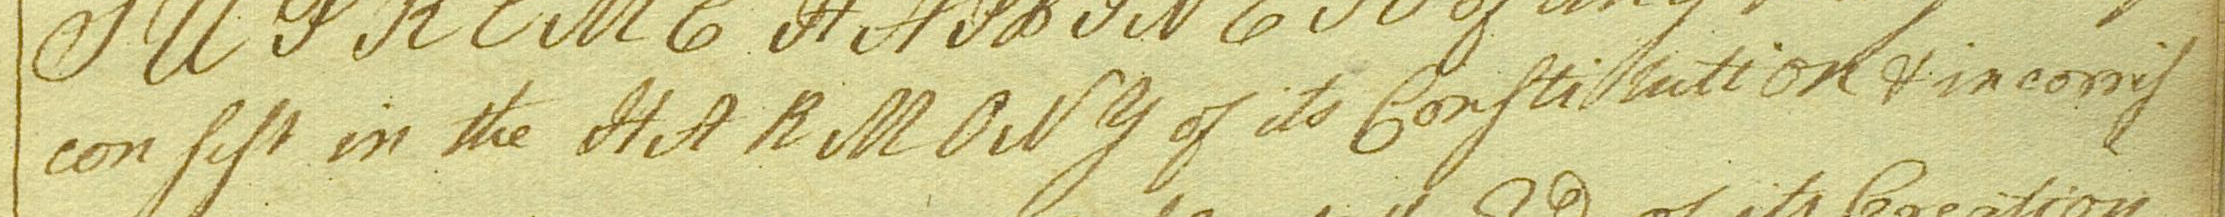consist in the HARMONY of its Constitution & in corres
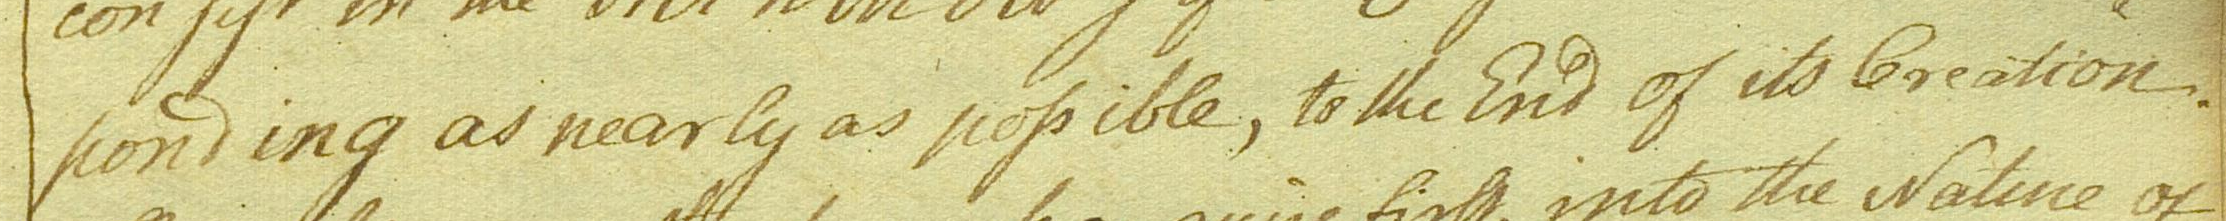ponding as nearly as possible, to the End of its Creation.
